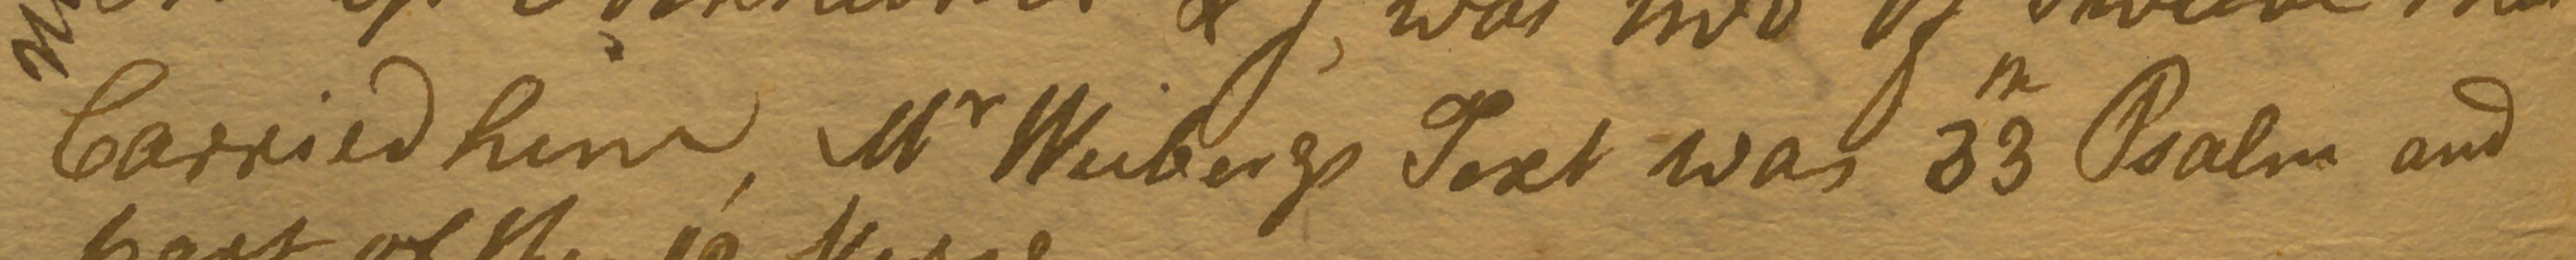Carried hine, M^r Weibergs Text was 33^th Psalm and
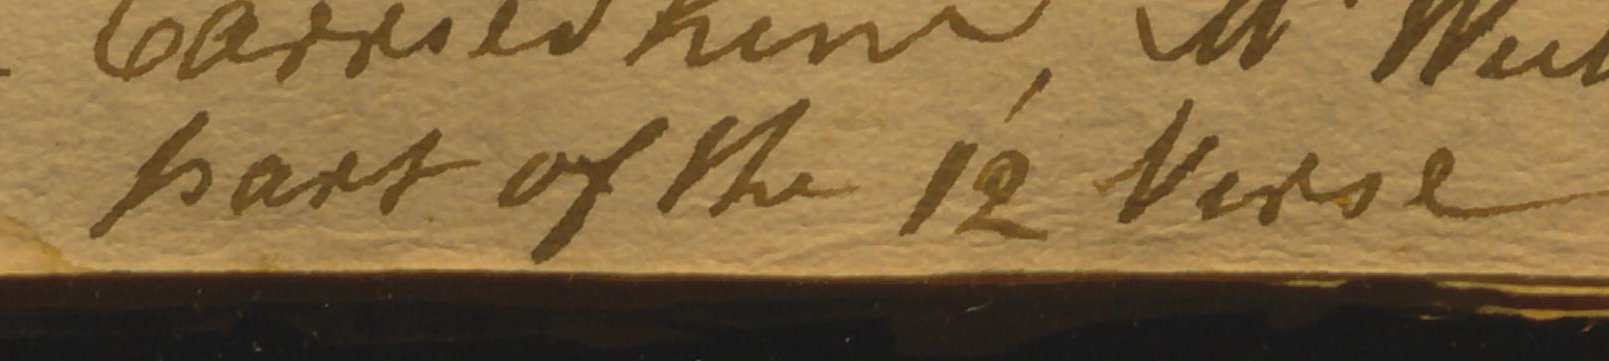part of the 12 Verse
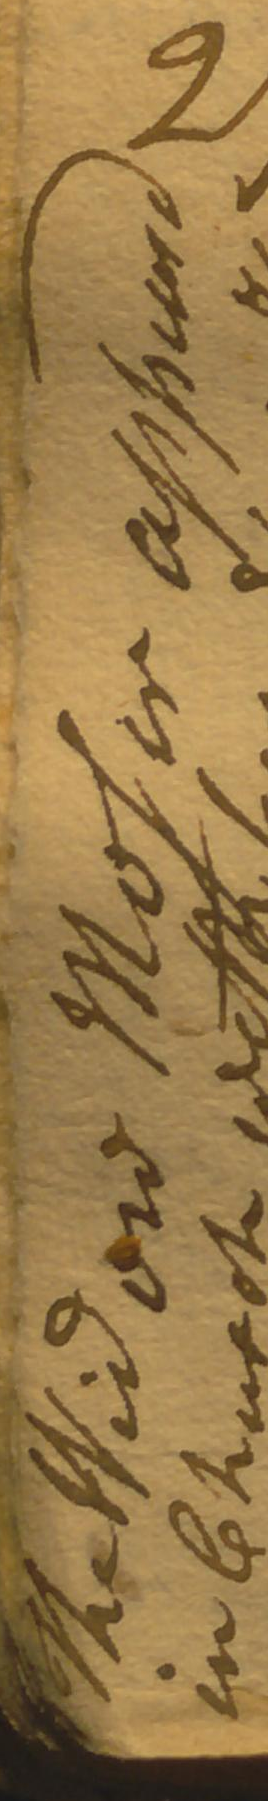the Widow Moser appeare
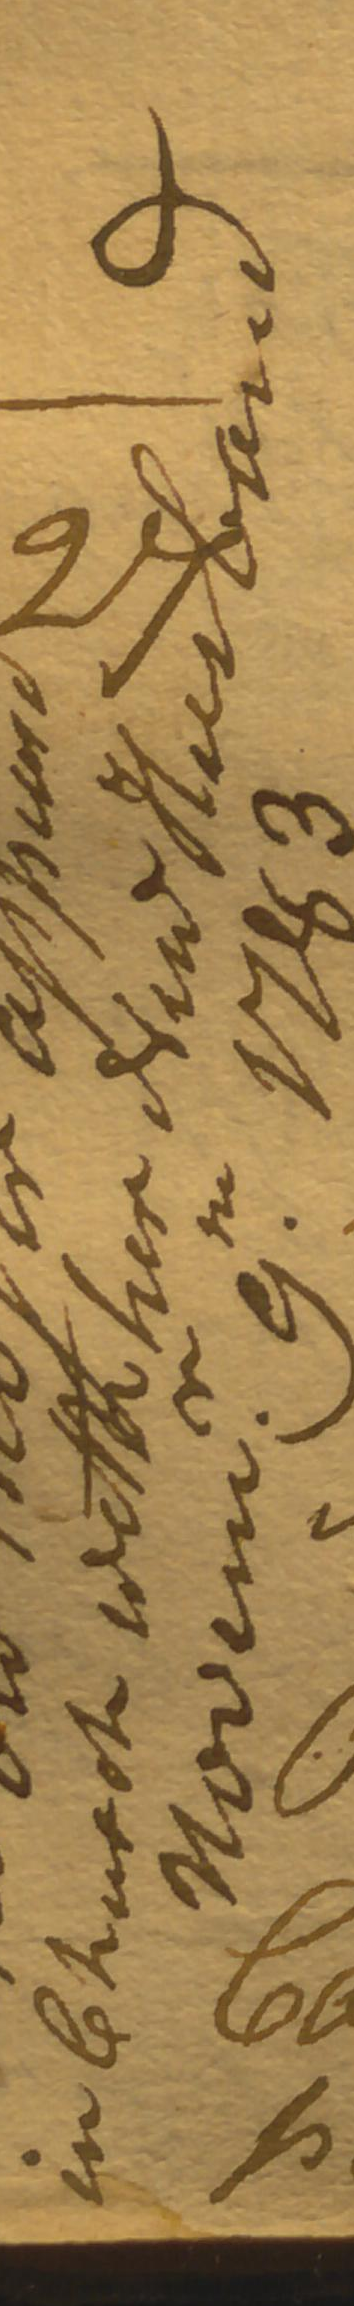in Church with her New Husband
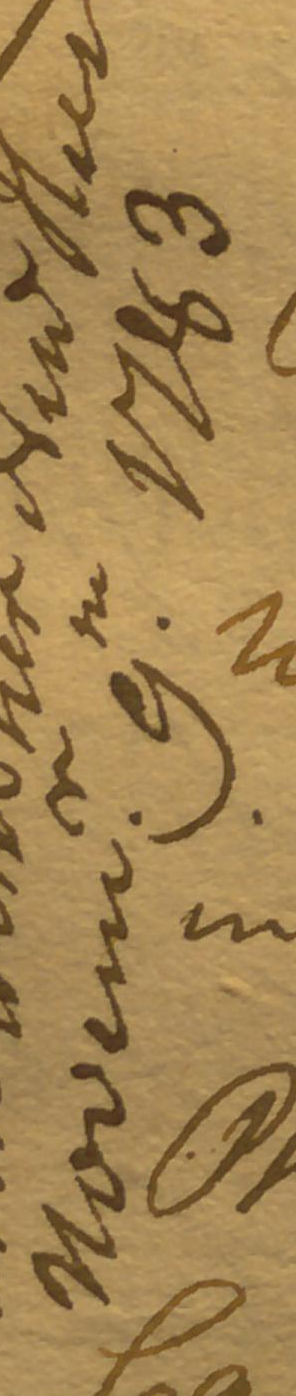Novem^r. 9^th. 1783
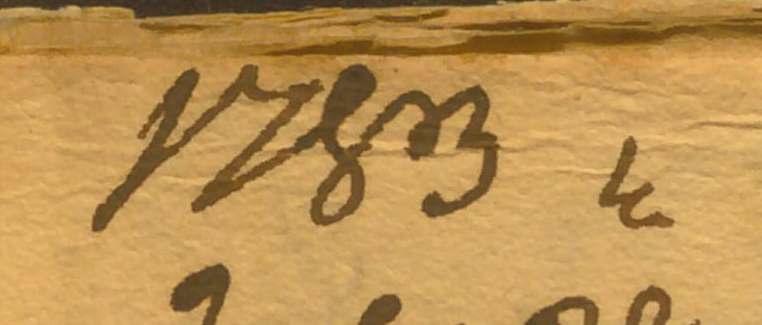1783
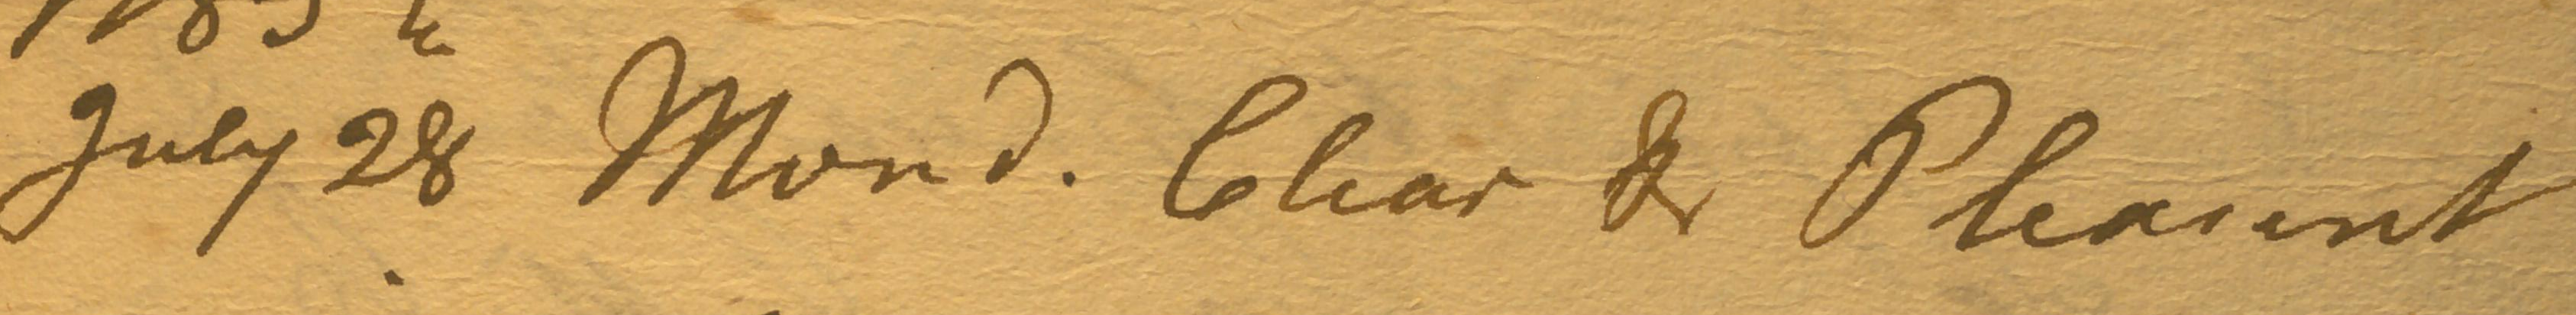July 28^th Mond. Clear & Pleasent
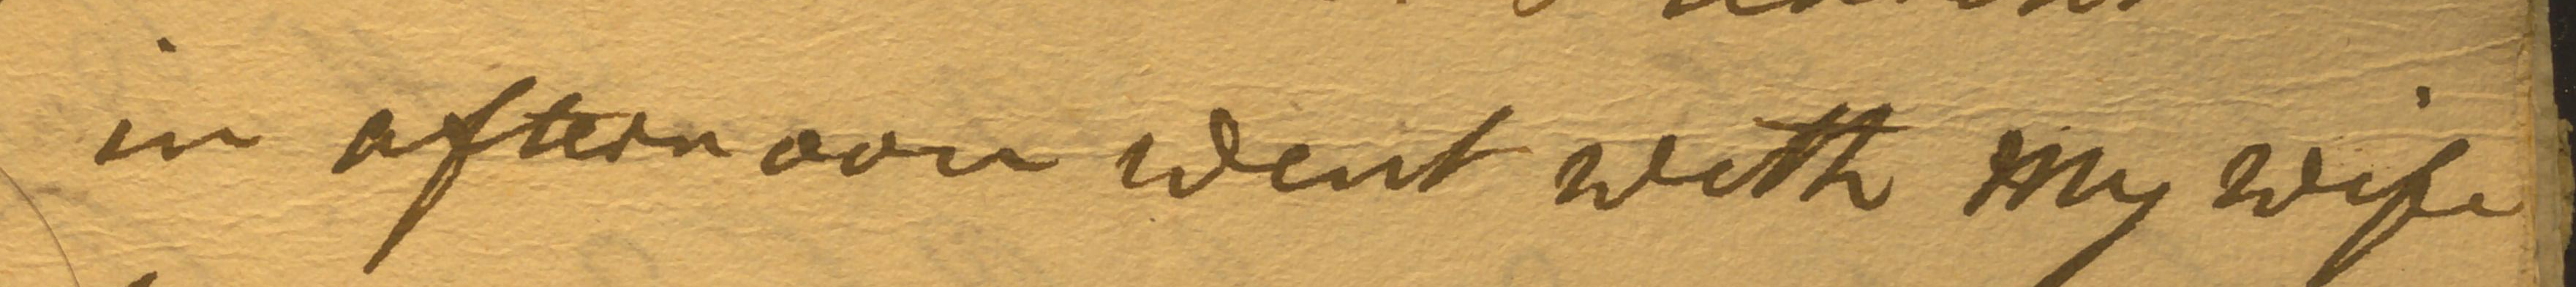in afternoon went with My wife
